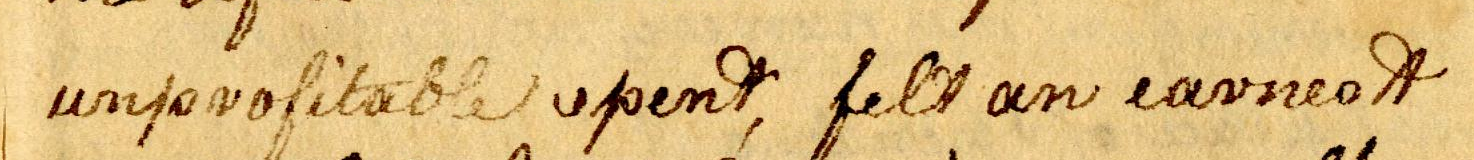unprofitable spent, felt an earnestt
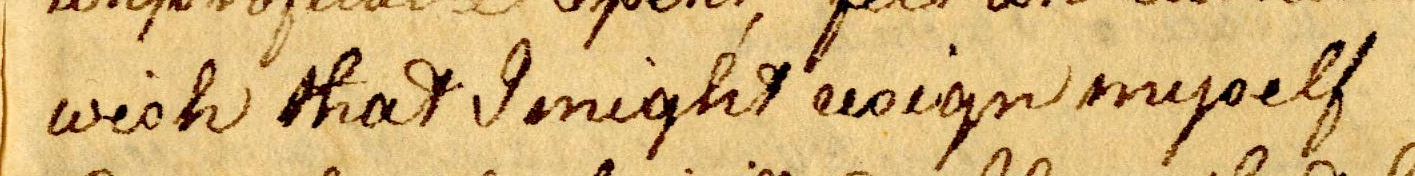wish that I might resign myself
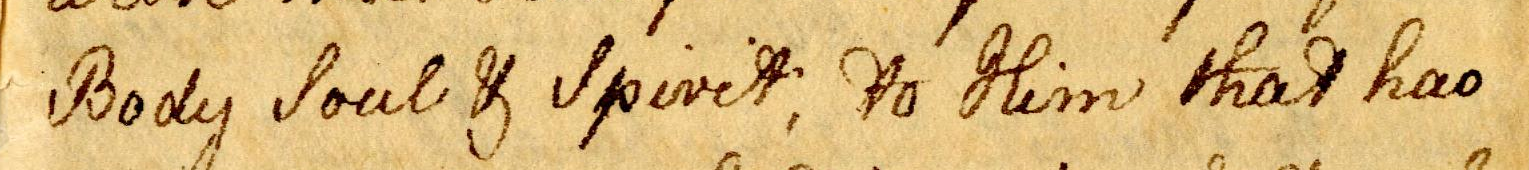Body Soul & Spirit, to Him that has
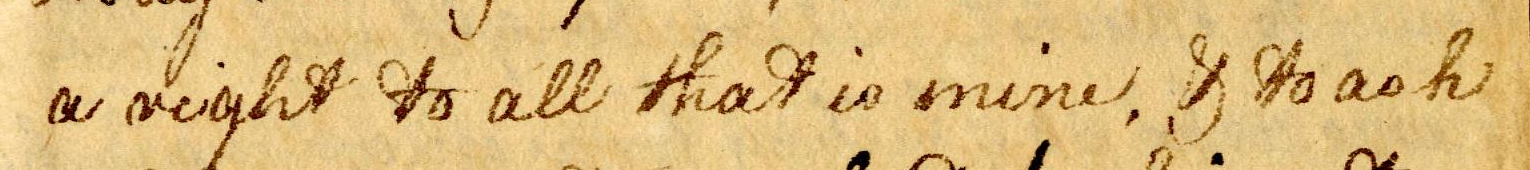a right to all that is mine, & to ask
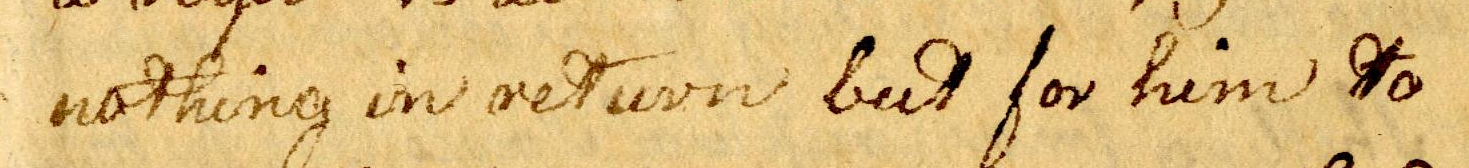nothing in return but for him to
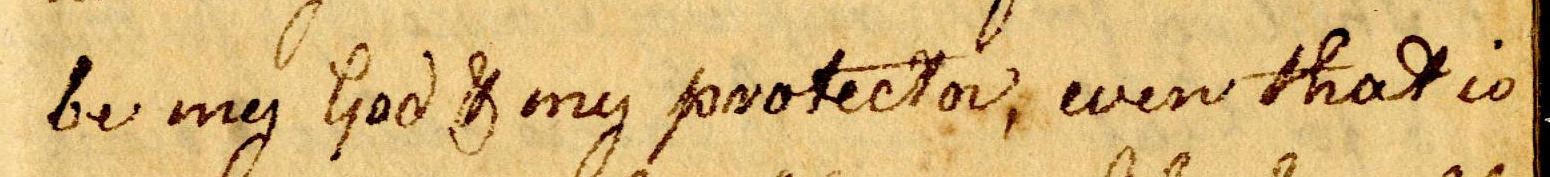be my God & my protector, even that is
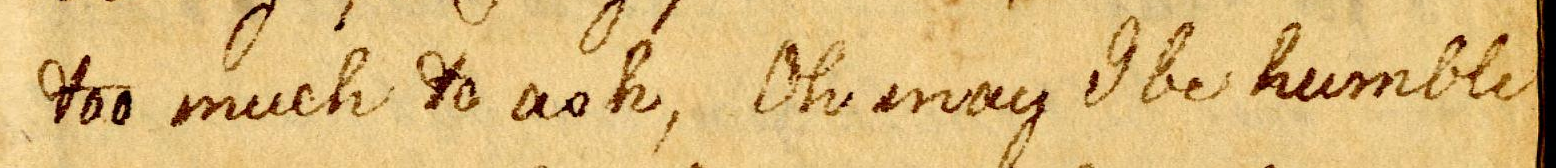too much to ask, Oh may I be humble
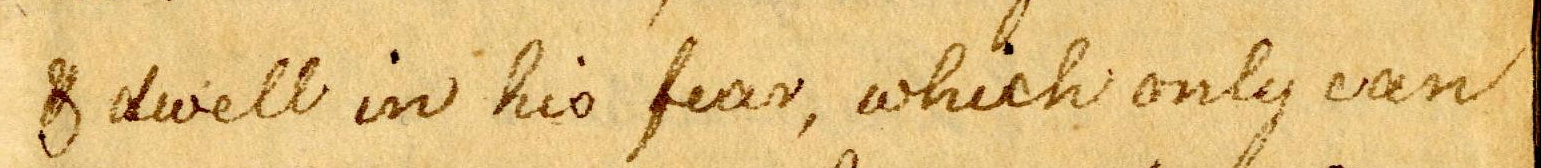& dwell in his fear, which only can
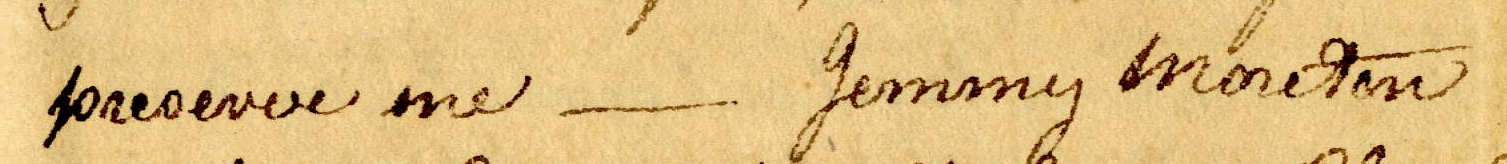preserve me- Jemmy Moreton
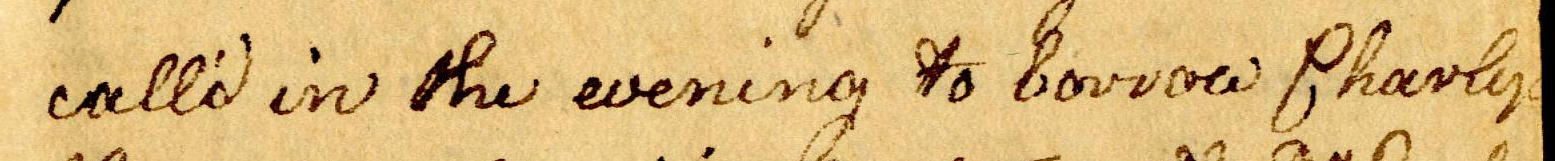call'd in the evening to borrow Charly
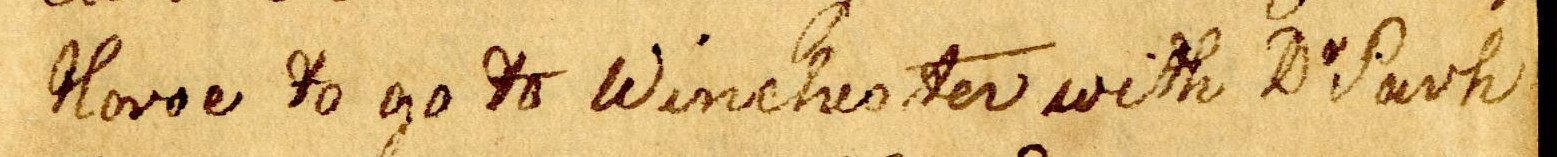Horse to go to Winchester with D^r Park
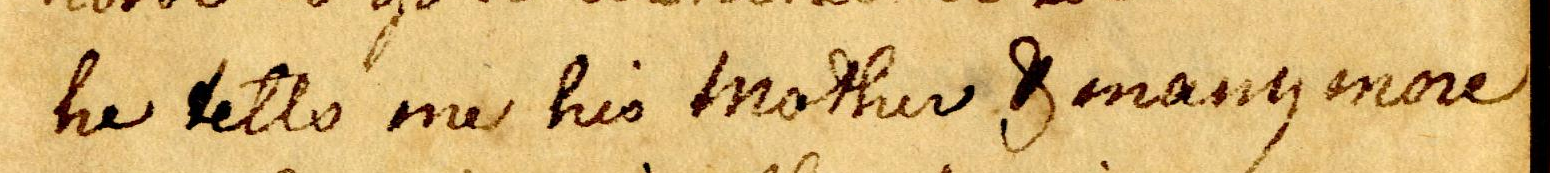he tells me his Mother & many more
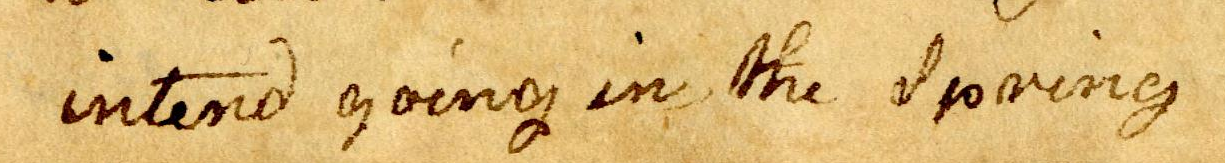intend going in the Spring
